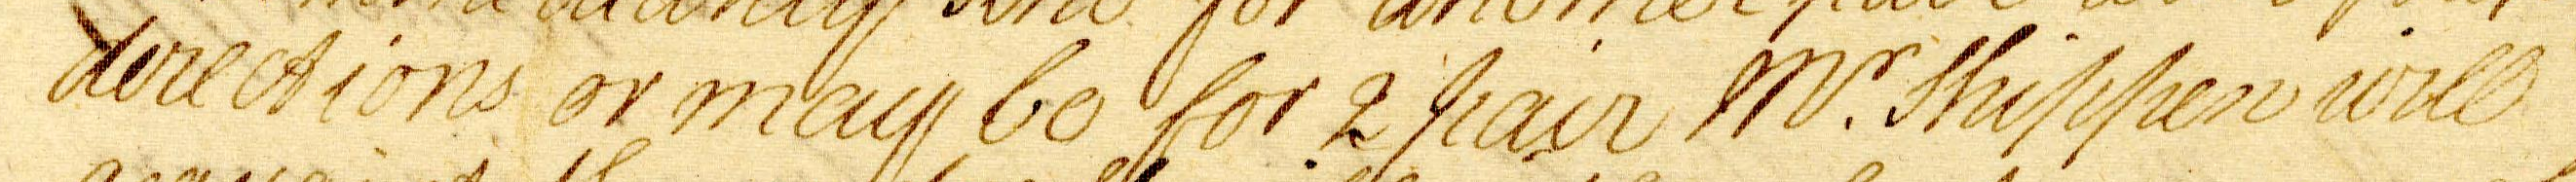directions or may be for 2 pair M^r. Shippen will
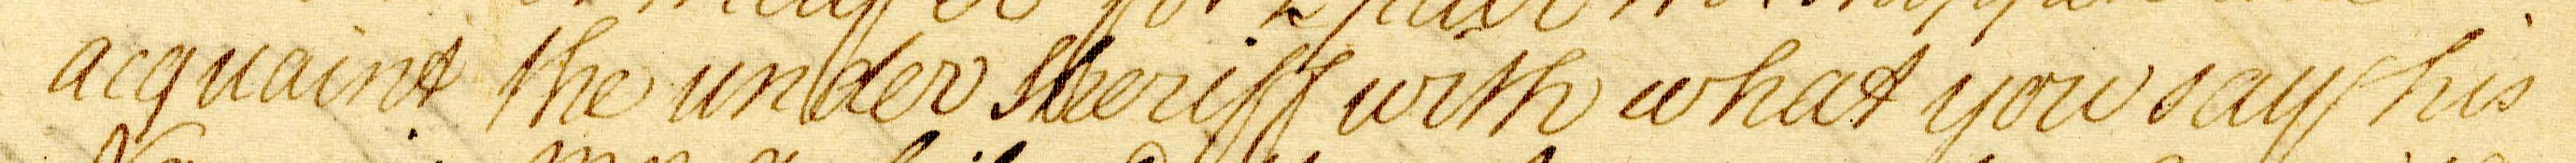acquaint the under Sheriff with what you say his
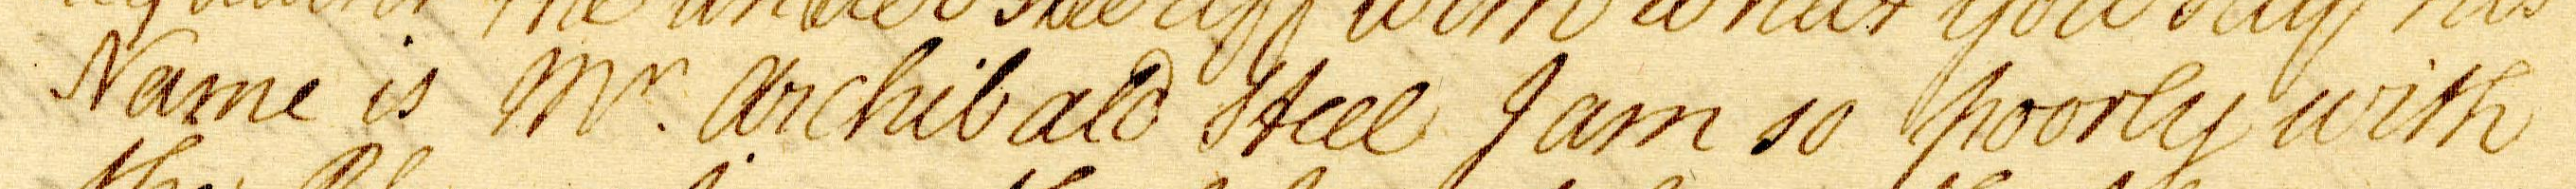Name is M^r. Archibald Steel I am so poorly with
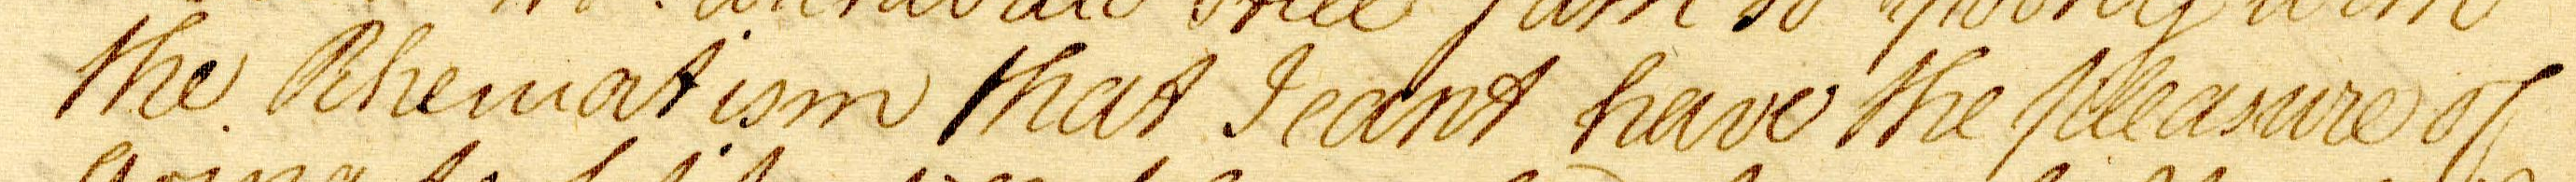the Rheumatism that I cant have the pleasure of
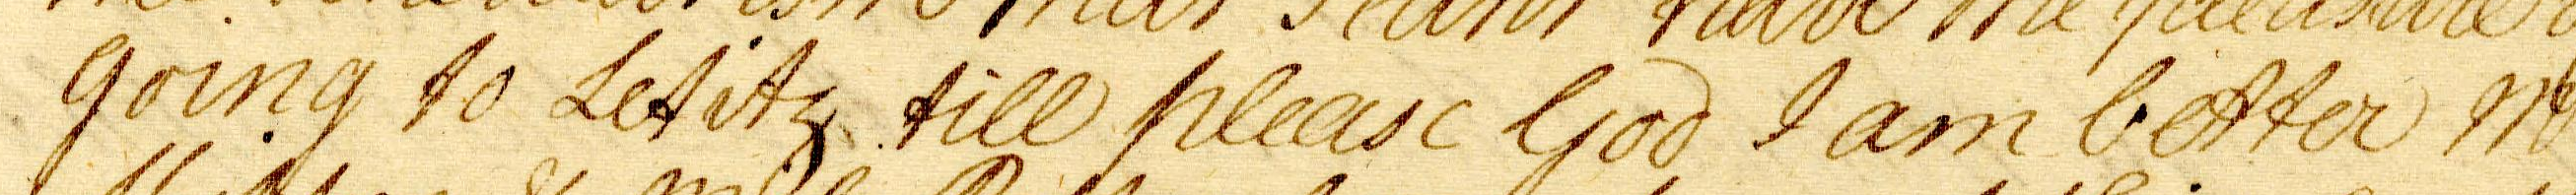going to Letitz till please God I am better M^r
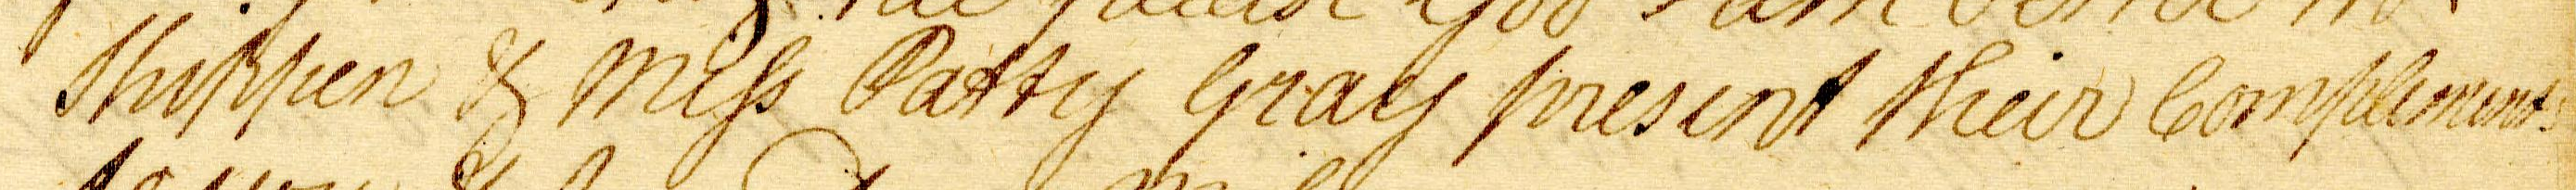Shippen & Miss Patty Gray present their Compliments
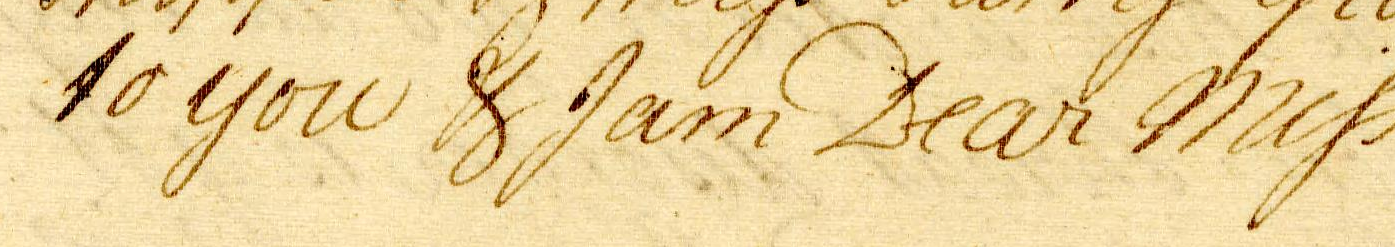to you & I am Dear Miss
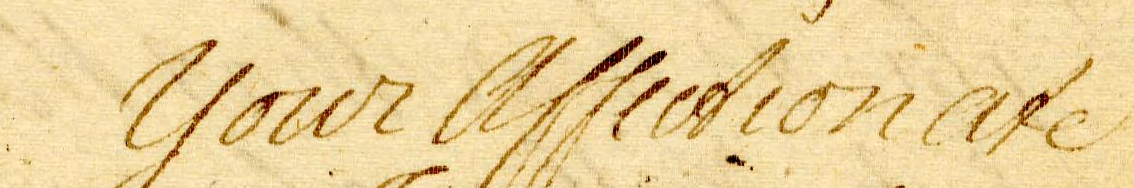Your Affectionate
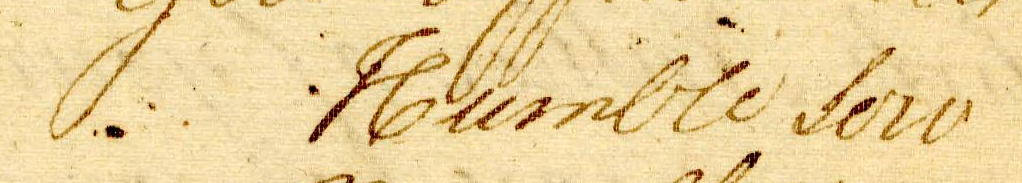Humble Serv
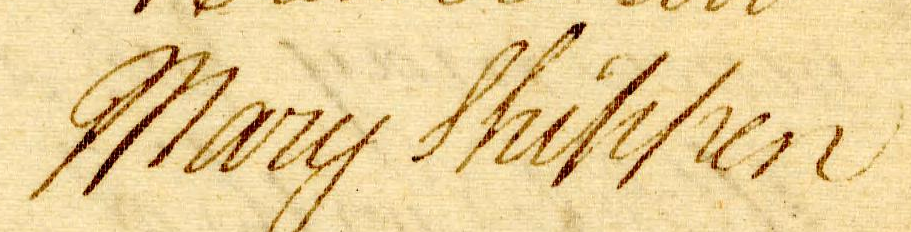Mary Shippen
